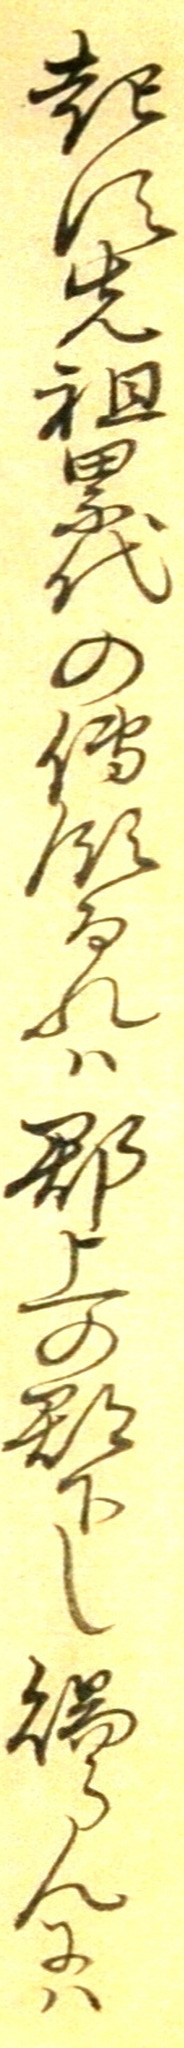起す先祖累代の伝領なれは郡上の郡下し賜らんには
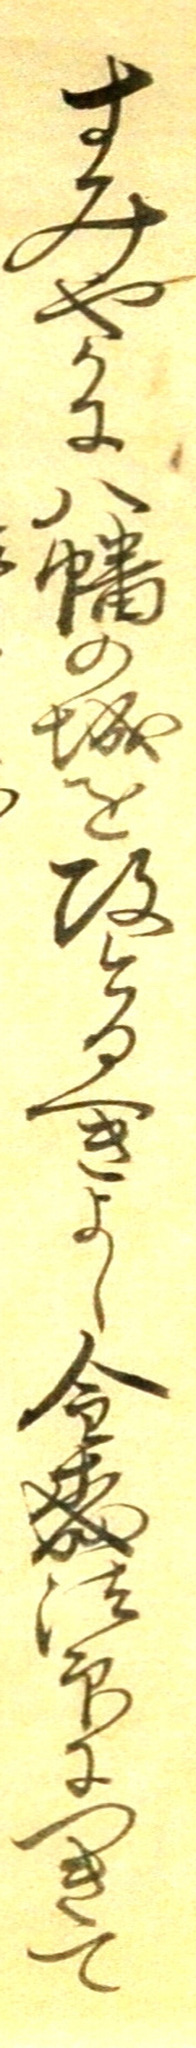すみやかに八幡の城を攻とるへきよし金森法印につきて
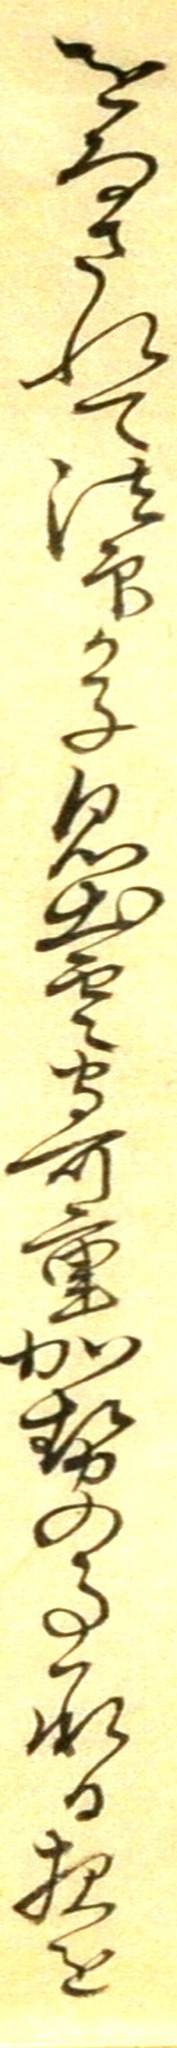をなされて法印か子息出雲守可重加勢の事承る夜を
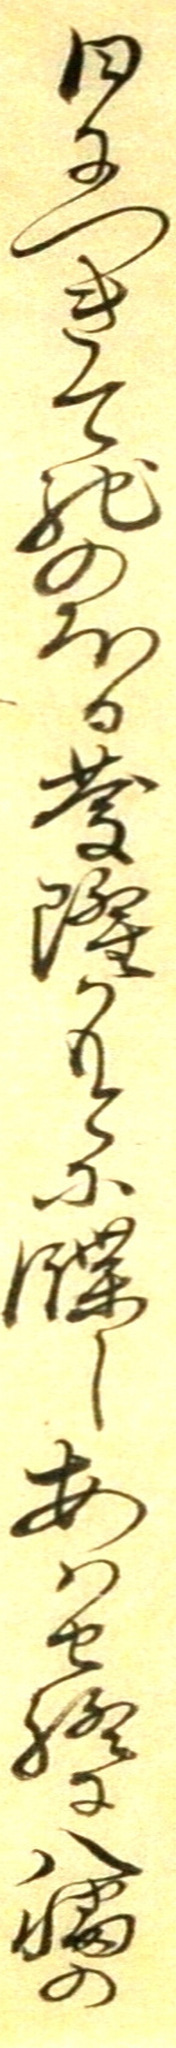日につきて馳のほる慶隆かもとに牒しあはせ終に八幡の
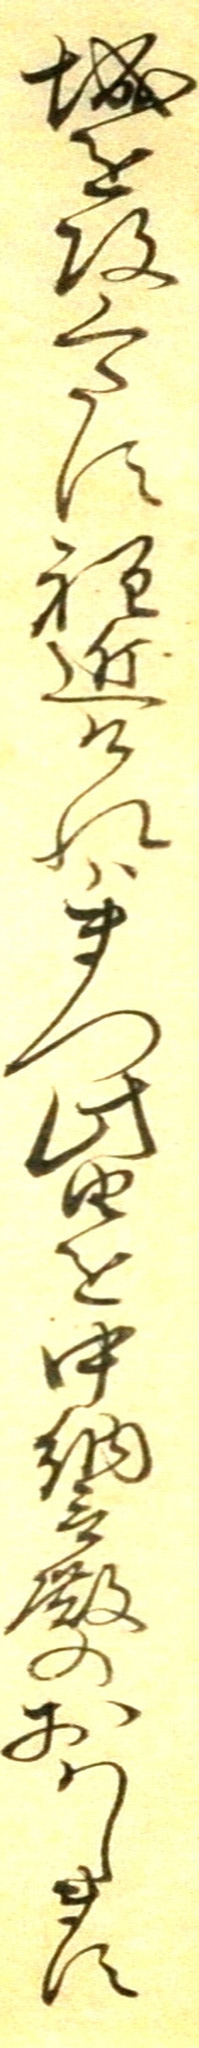城を攻くたす程近けれはまつ此由を中納言殿のおはします
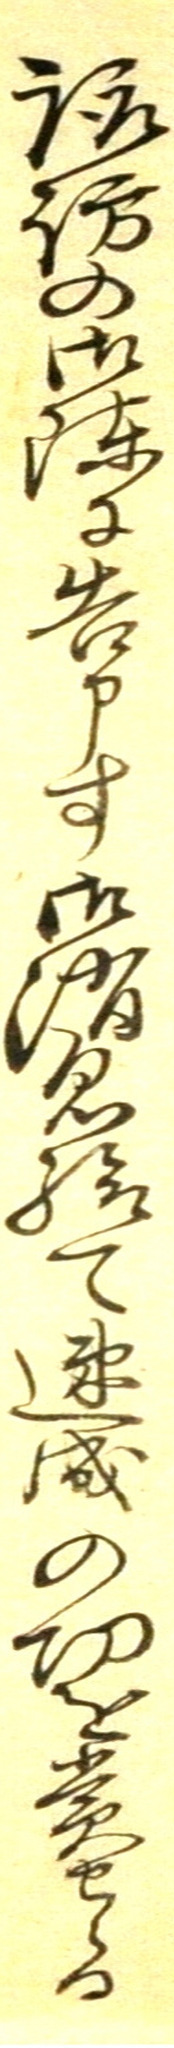諏訪の御陣に告申す御消息給て速成の功を賞せらる
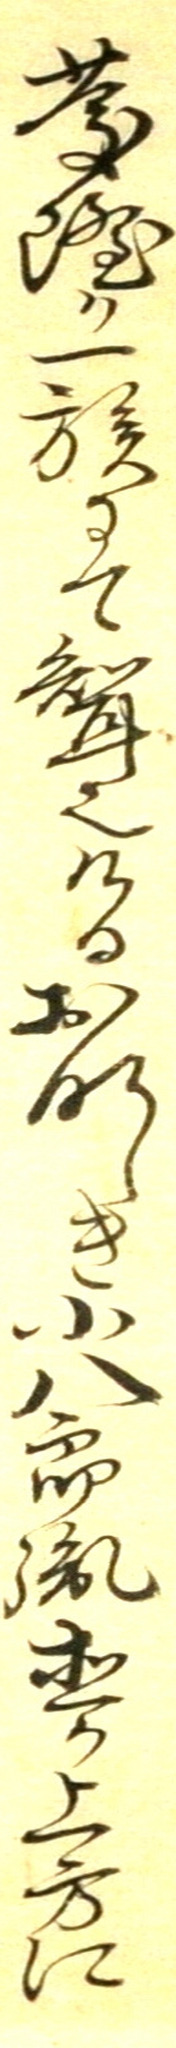慶隆か一族にて聟也けるおなしき小八郎胤直か上方に
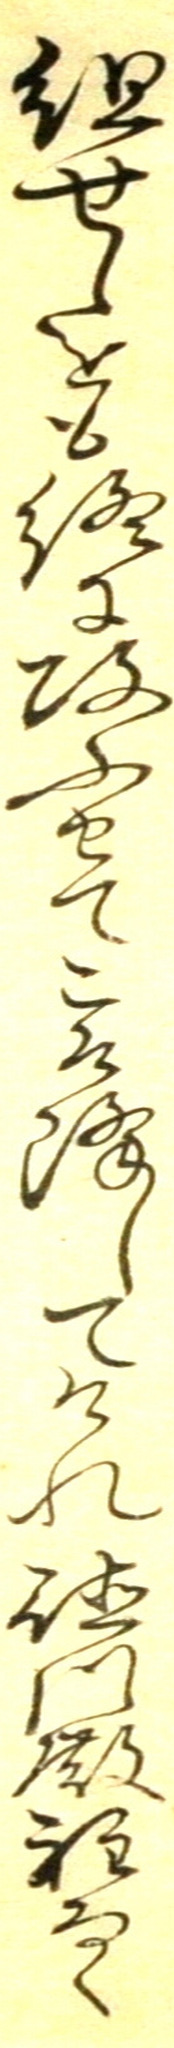組せしをも終に攻ふせてこそ降してけれ徳川殿程なく
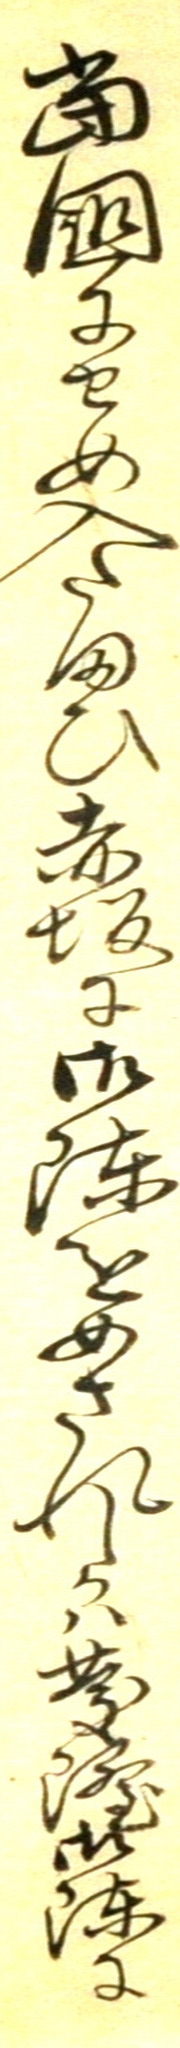当国にせめ入たまひ赤坂に御陣をめされしかは慶隆御陣に
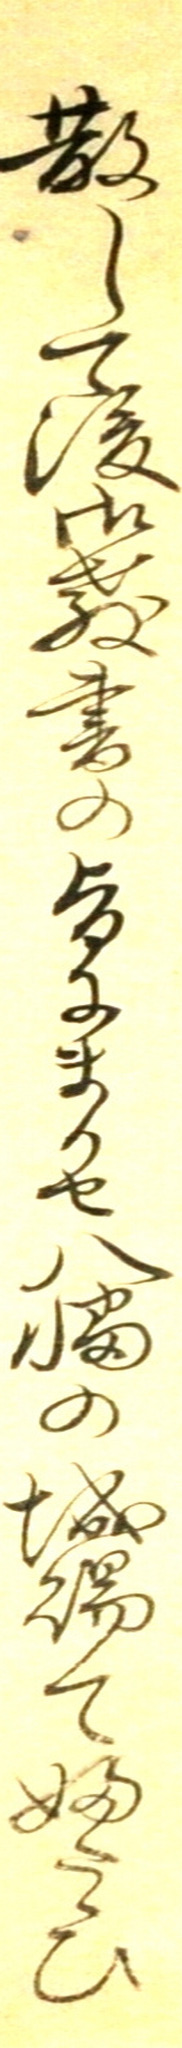散して後御教書の旨にまかせ八幡の城賜てふたゝひ
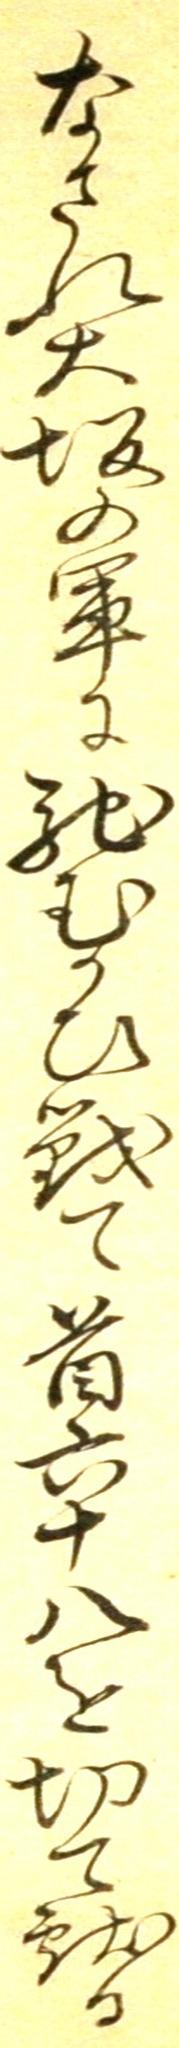なされ大坂の軍に馳むかひ戦て首六十八を切て献る
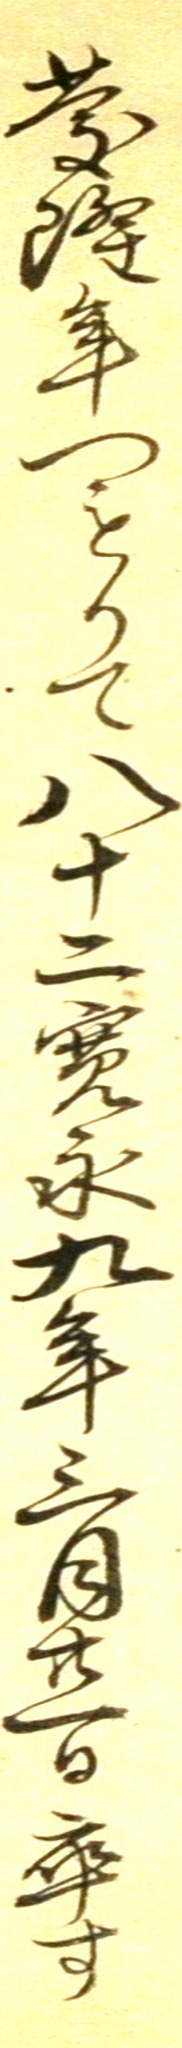慶隆年つもりて八十二寛永九年三月廿一日卒す
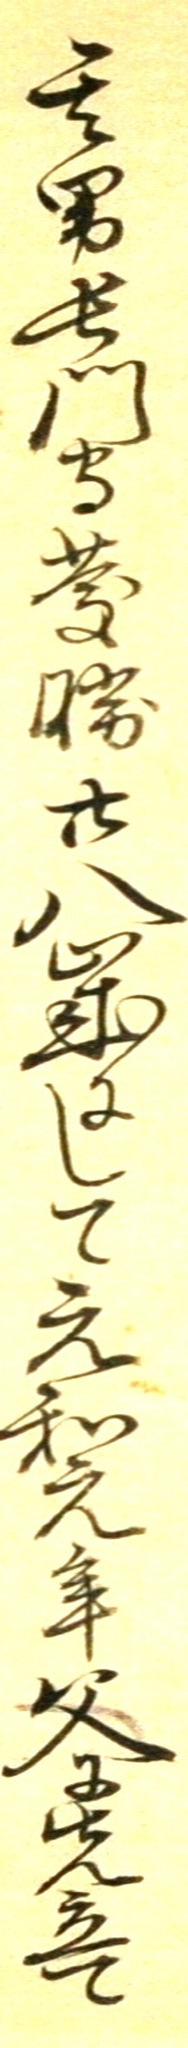其男長門守慶勝廿八歳にして元和元年父に先立て
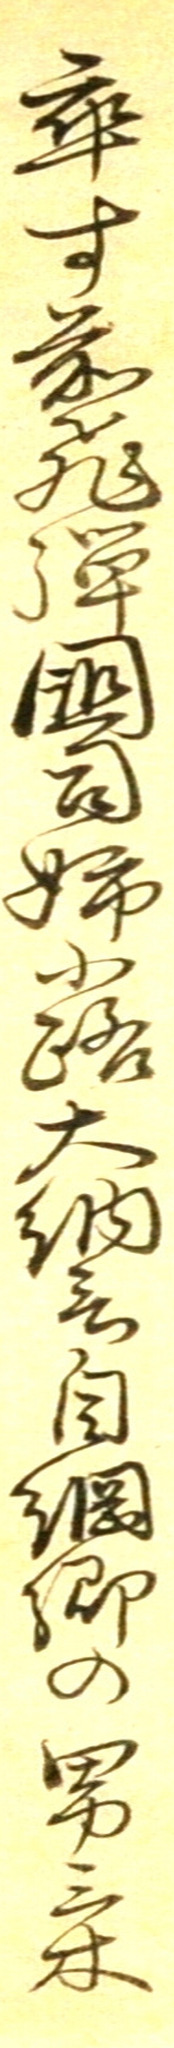卒す前飛騨国司姉小路大納言自綱卿の男三木
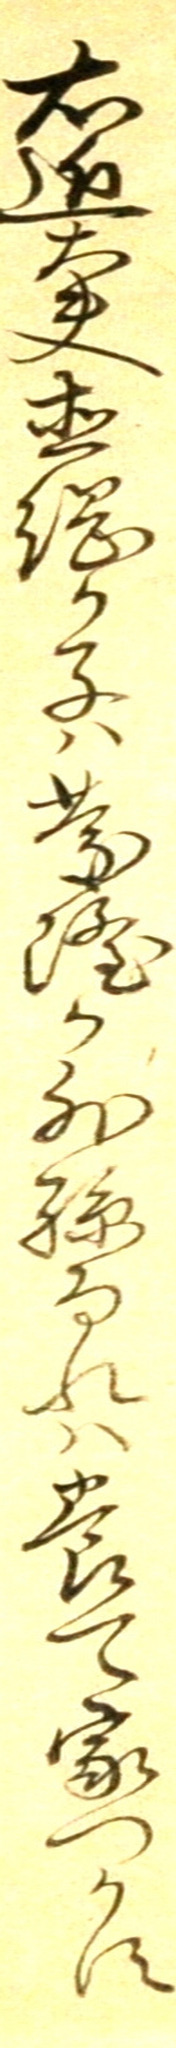右近大夫直綱か子は慶隆か外孫なれは養て家つかす
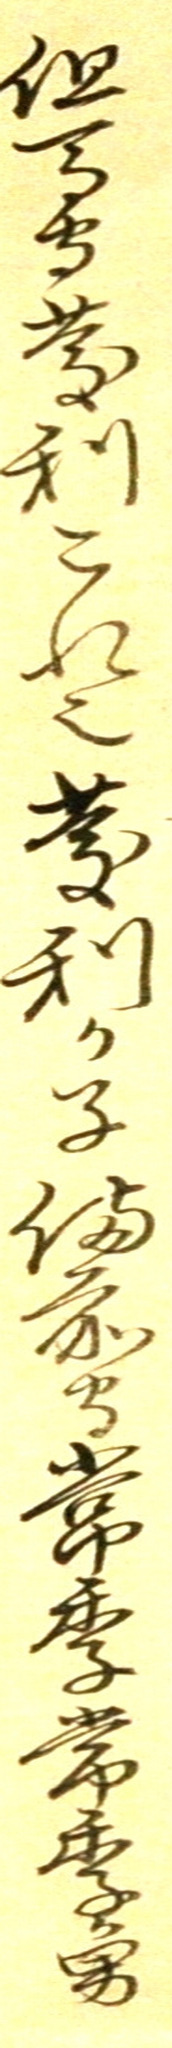但馬守慶利これ也慶利か子備前守常季常季か男
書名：藩翰譜（九・上）
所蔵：伊那市立高遠町図書館・合同会社AMANE
